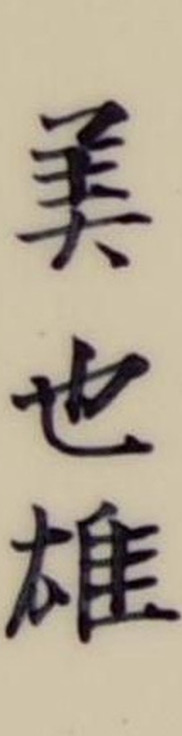美也雄
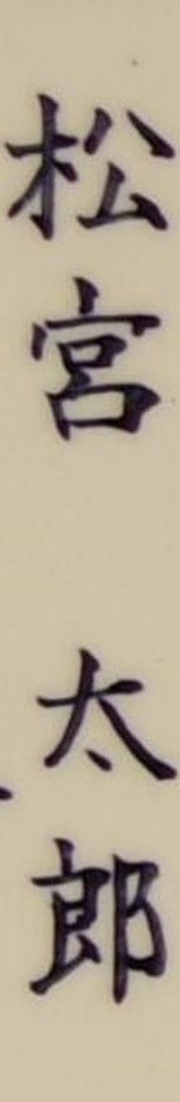松宮太郎
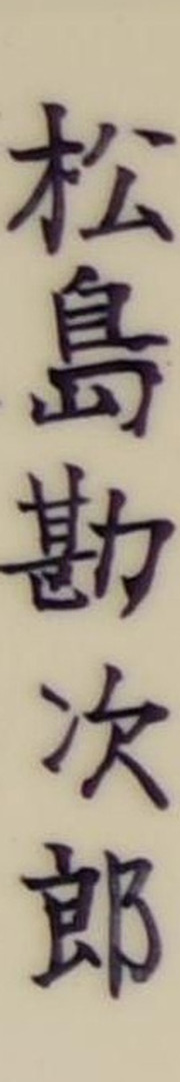松島勘次郎
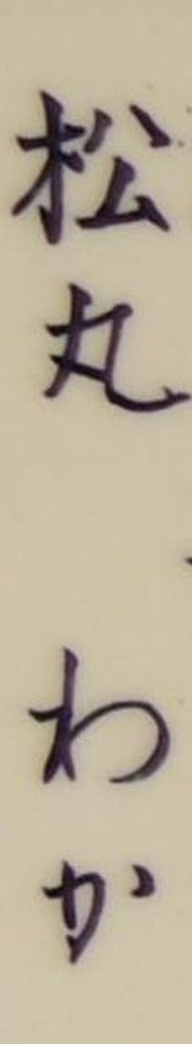松丸わか

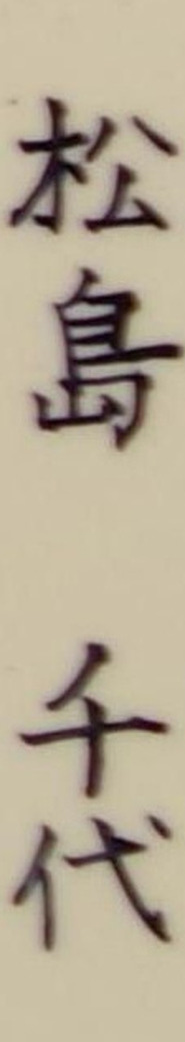松島千代
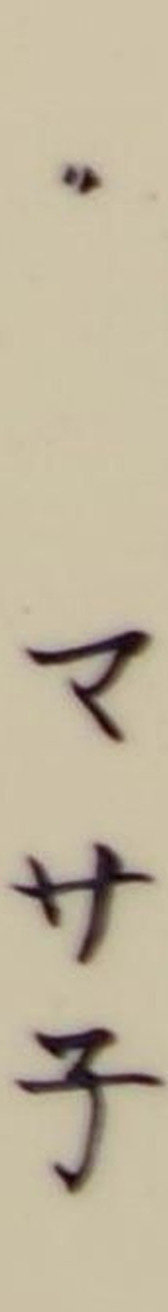マサ子
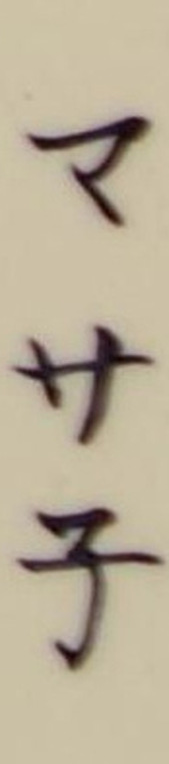マサ子
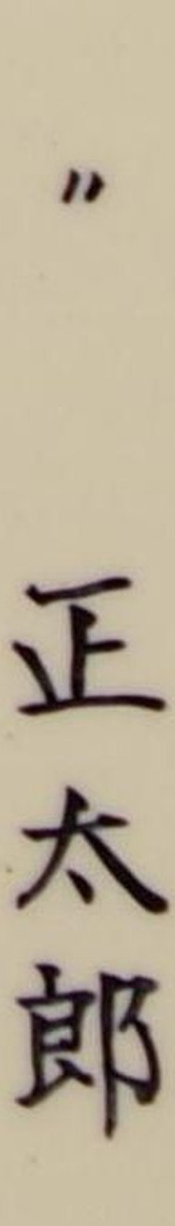正太郎
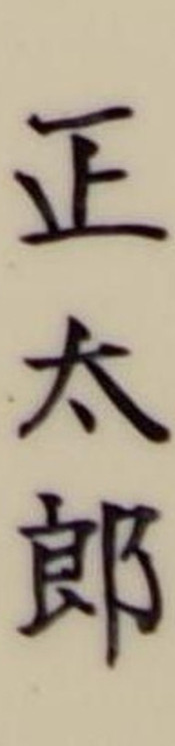正太郎
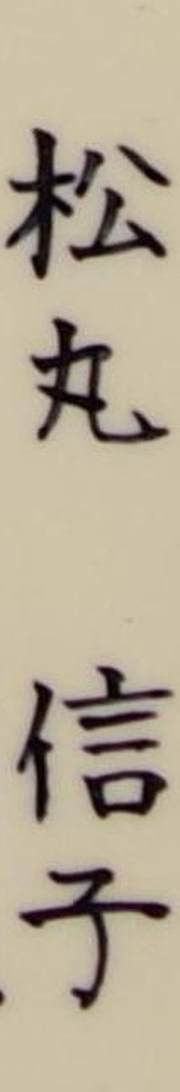松丸信子
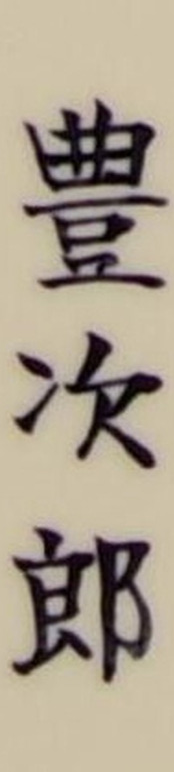豊次郎
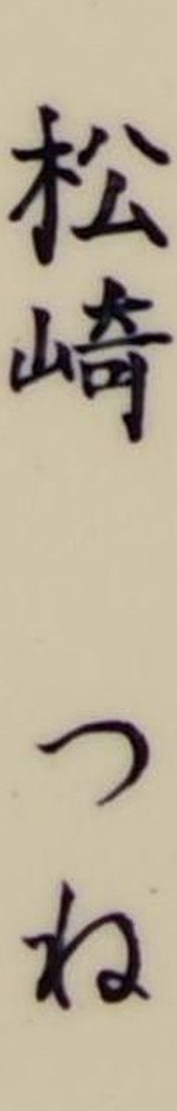松崎つね
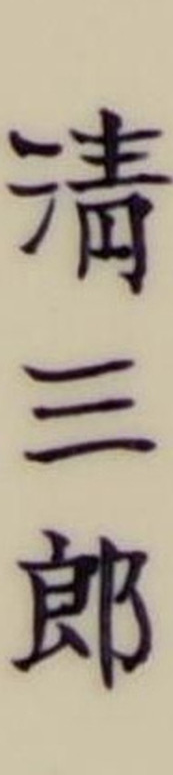清三郎
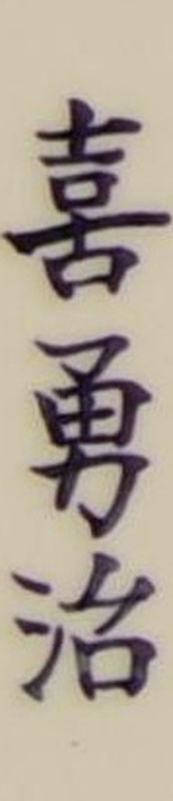喜勇治

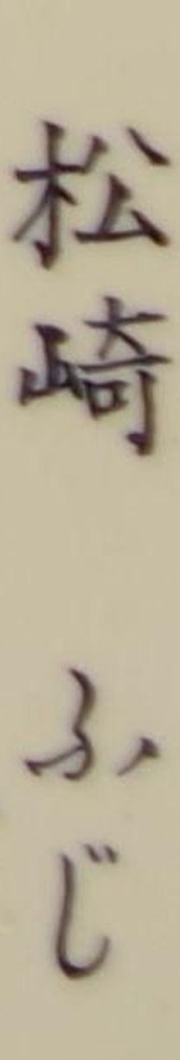松崎ふじ
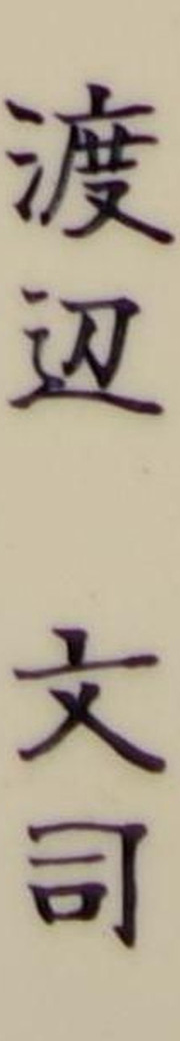渡辺文司
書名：A~D
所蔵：koyasan kongobuji
